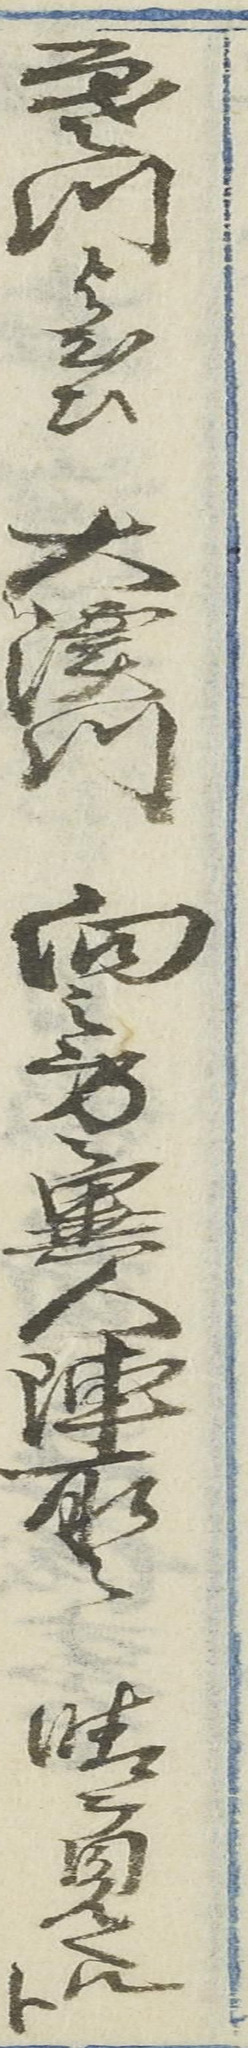寒川と云ひ大濱川向之方異人陣取之晴テ見ヘルト
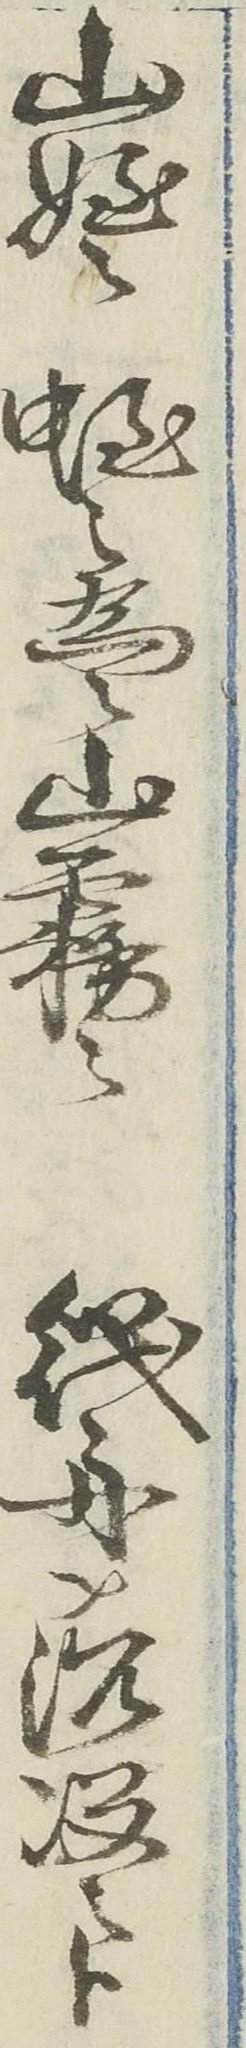山姪二蛭之為二山霧二筏舟ヲ沈没二ト
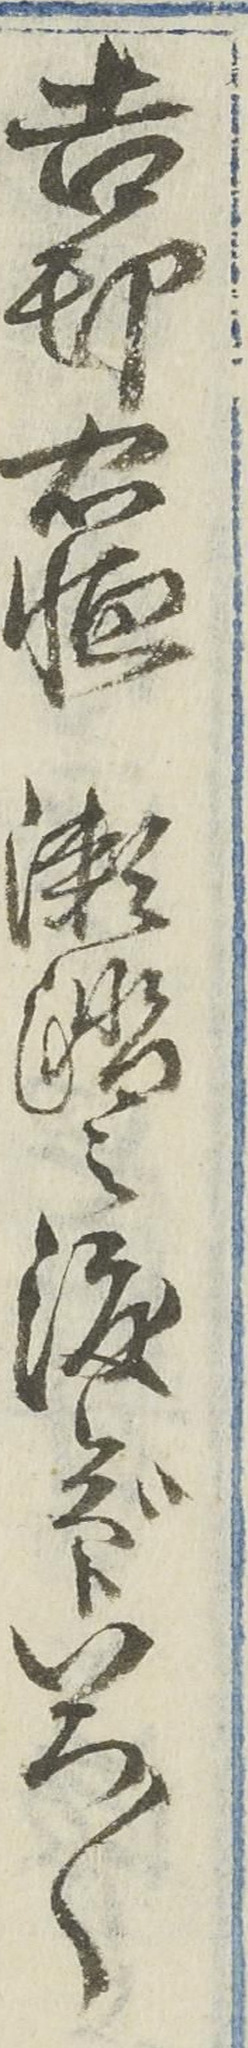吉邨忠恒瀬踏二渡らズトいろ〳〵
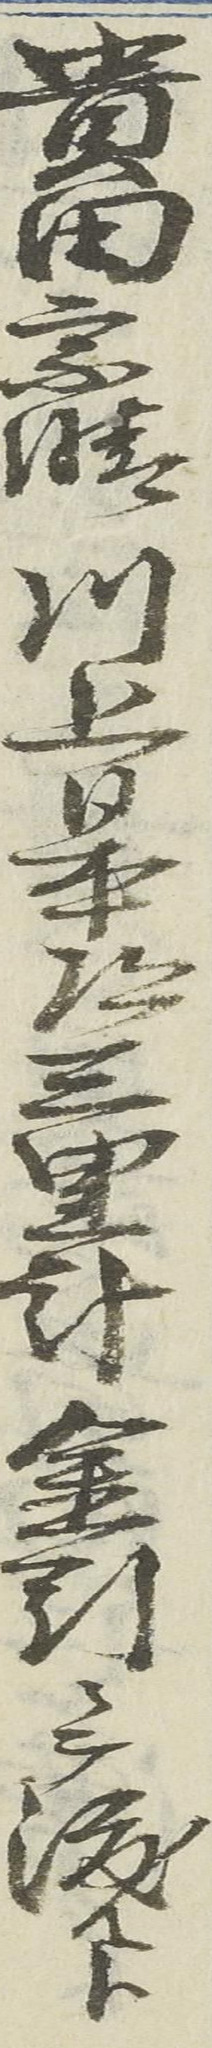貴田宗晴川上日本道三里計金引ニテ渡ㇽト
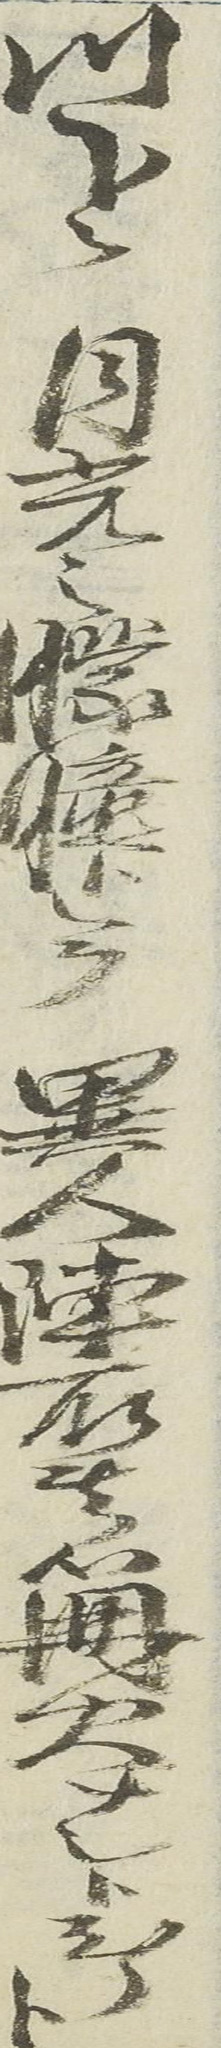川下二月光之朦瞳トシテ異人陣取其篝火ナレト云ウト

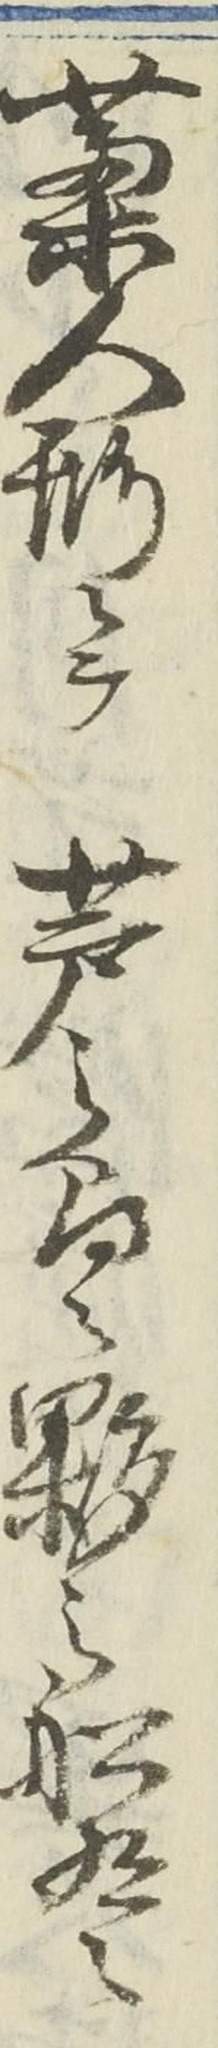藁人形ニテ芦之間ニ夥シ船有之
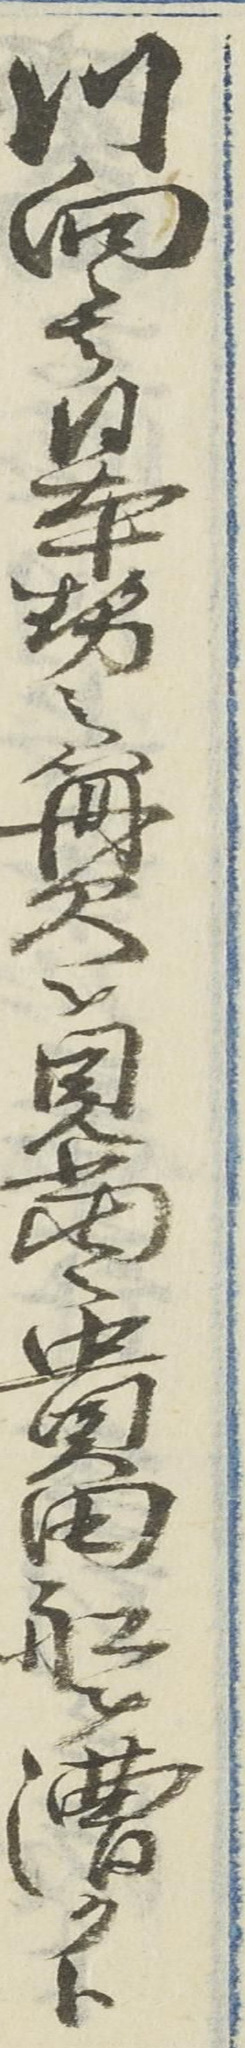川向ニは日本勢之箒火ヲ目当ニ貴田船ヲ漕クト
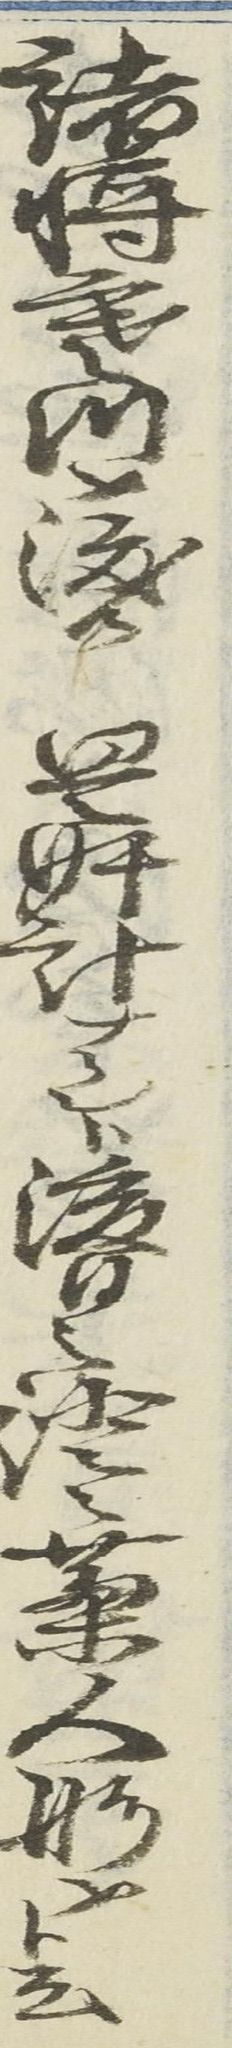諸将寒川ヲ渡ル是奸計ナラント後日之證ニ藁人形ヲト云
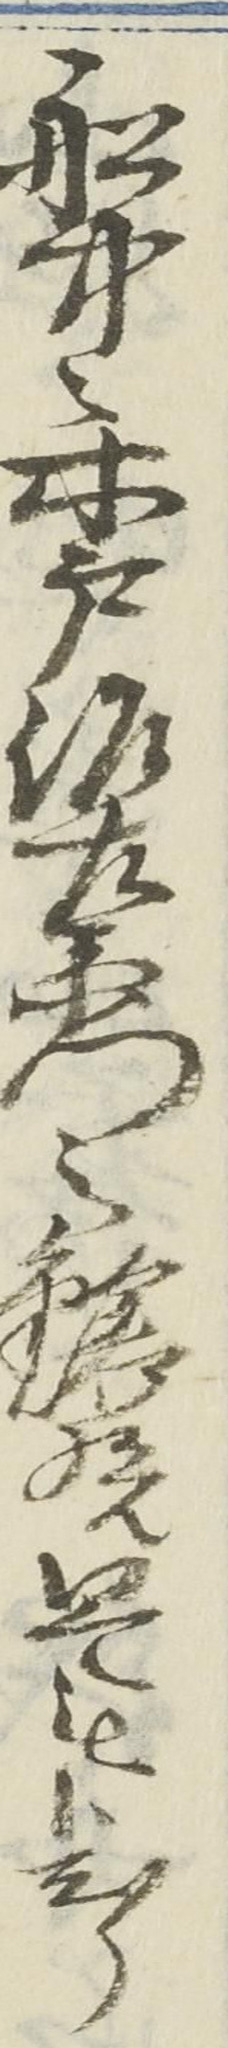船中ニ木戸作左衛門之鎗有ル是もト云ウ
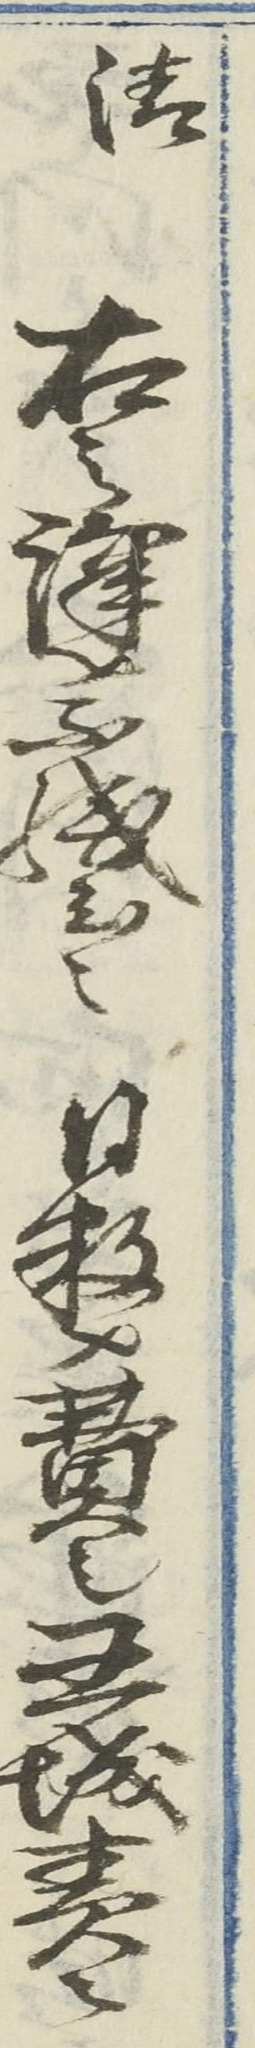清右之譯ヲ不残云也日数ヲ費シ王城責ニ
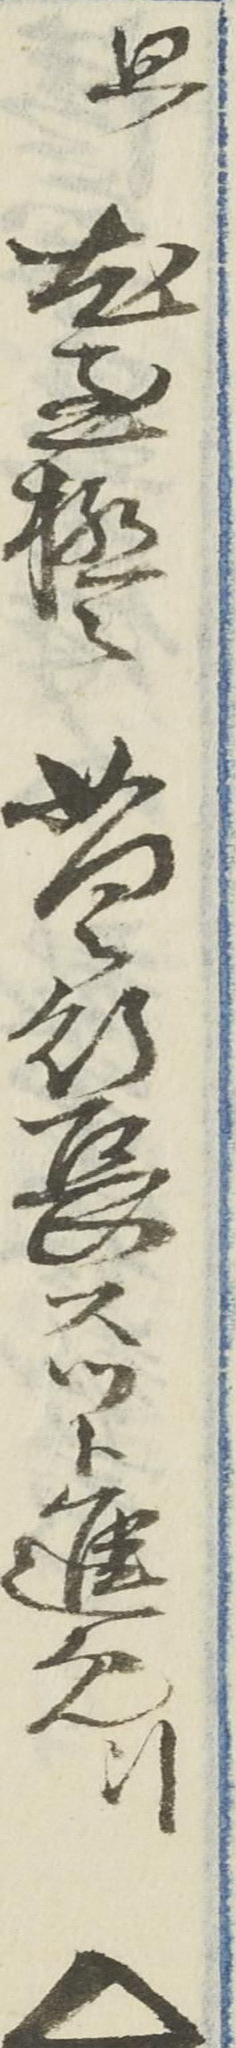且尤至極ニ如何ニ行長スツト進め△
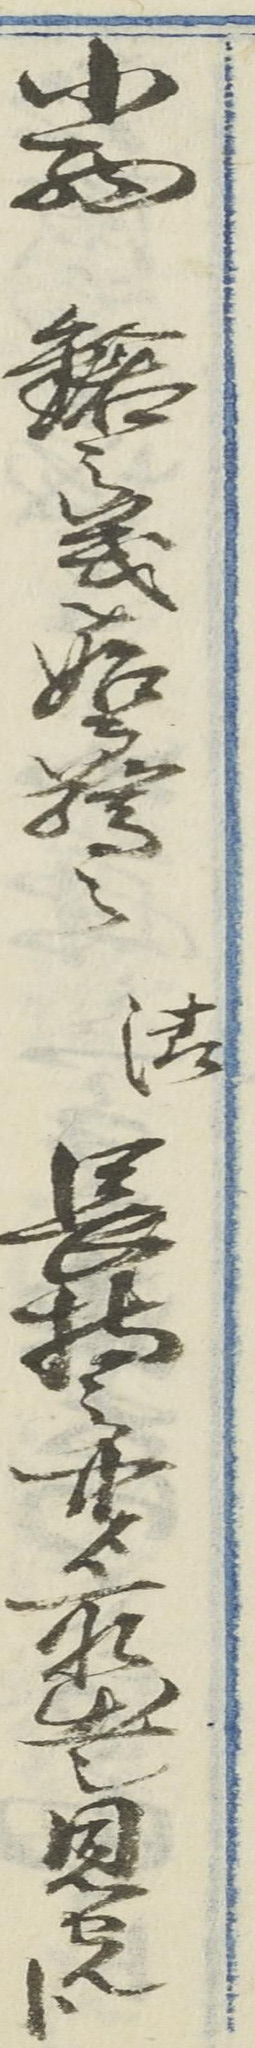小西鎗之義ヲ始テ驚之清長持之中ゟ取出見セント
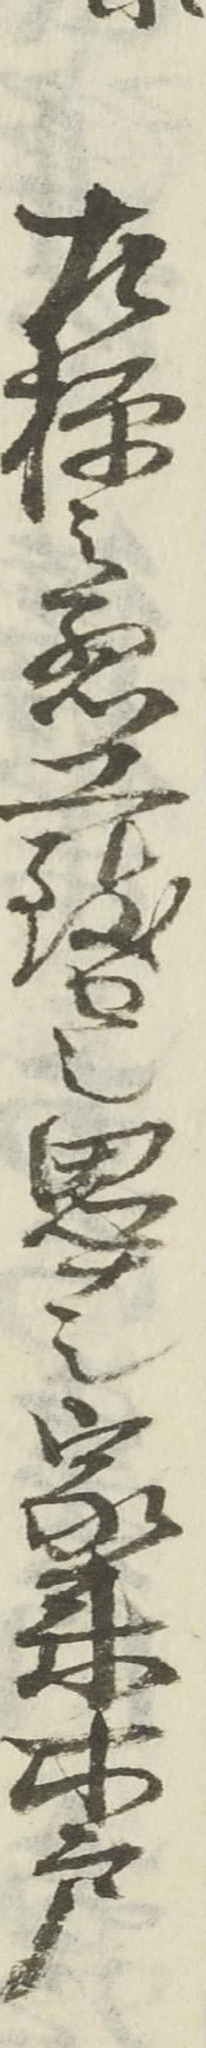小左様之悪工致セシ思ナシ家来木戸
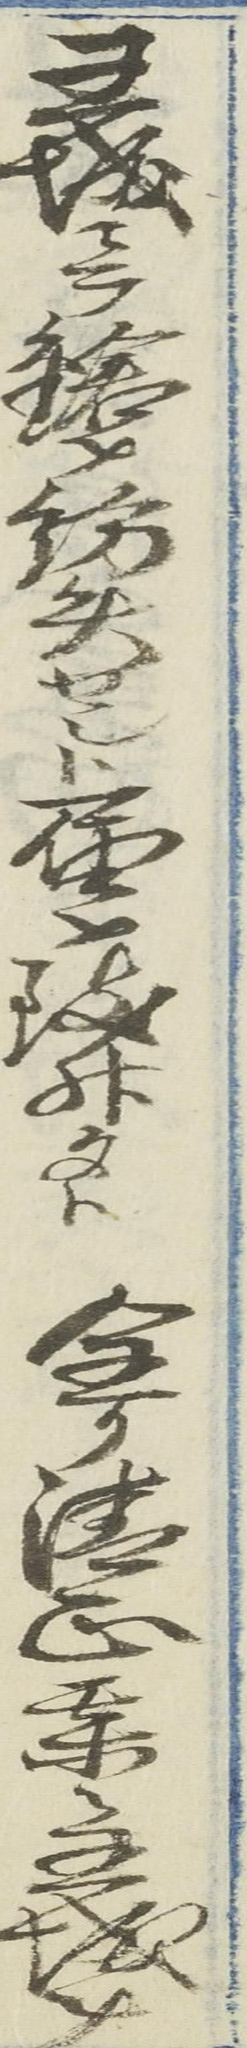王城ニテ鎗ヲ紛失セシト届ヲ致升タト全ク清正某ニ王城ヲ
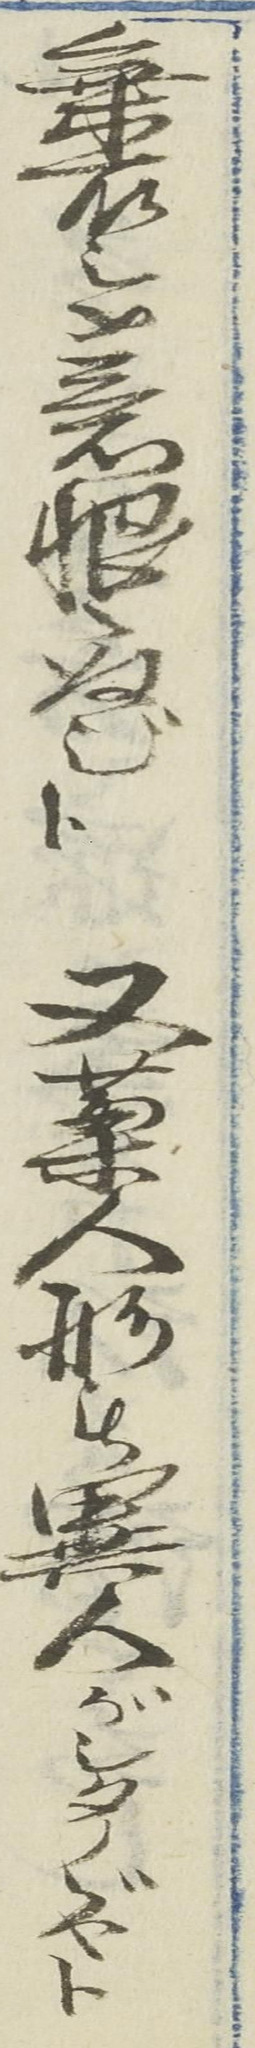乗取シヲ意恨ニ存ジト又藁人形も異人ガシタノジヤト
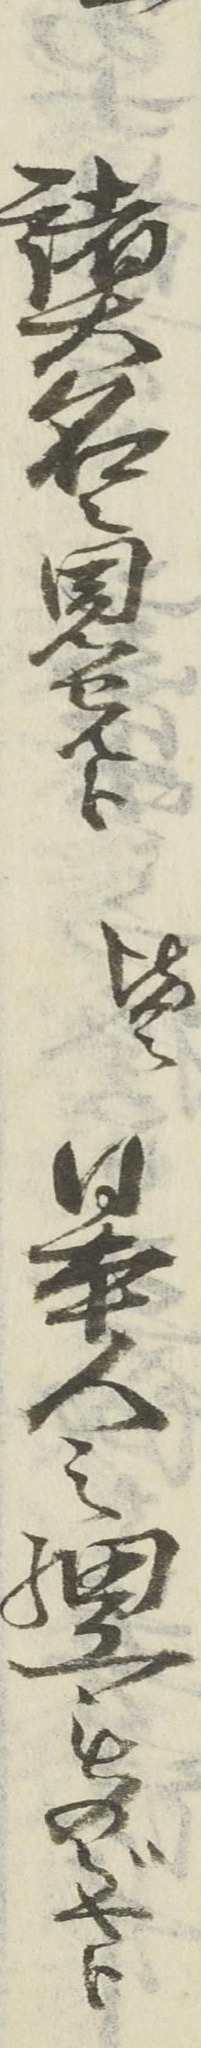且諸大名ニ見セント皆々日本人之細工ものじやト
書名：伏水大地震
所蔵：東京大学地震研究所図書室 Earthquake Research Institute Library, The University of Tokyo, JAPAN
